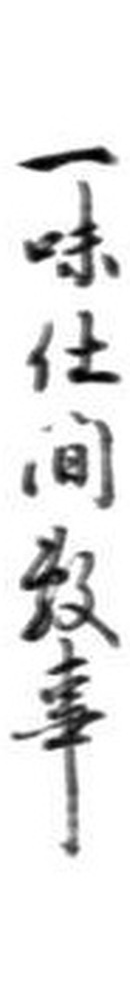一味仕間敷事
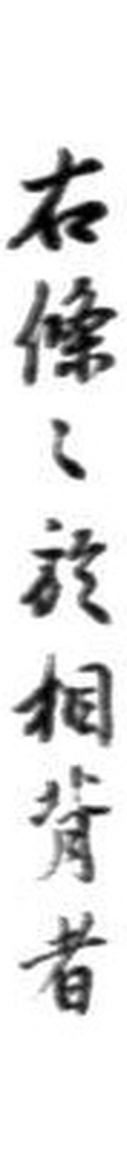右条々於相背者

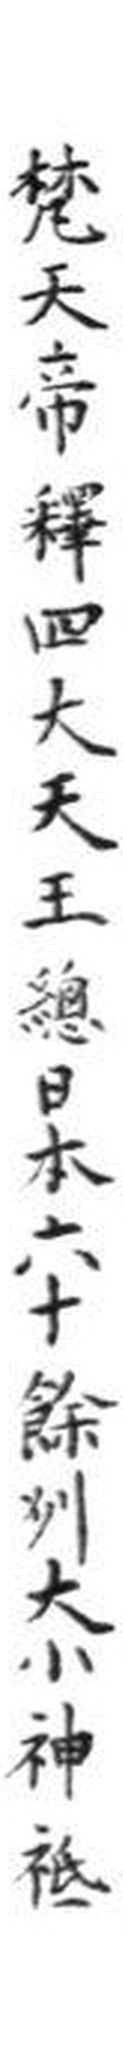梵天帝釈四大天王総日本六十余州大小神祇
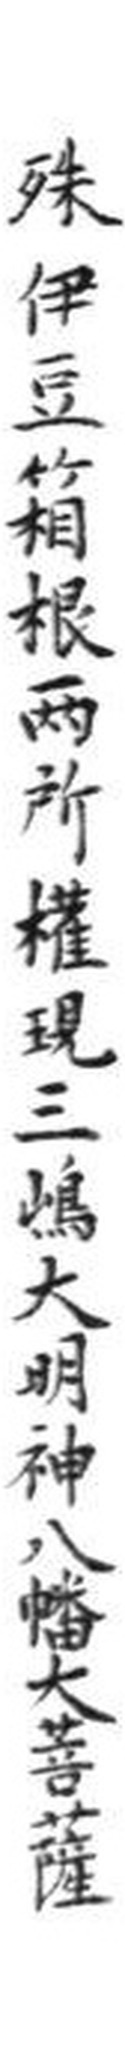殊伊豆箱根両所権現三嶋大明神八幡大菩薩
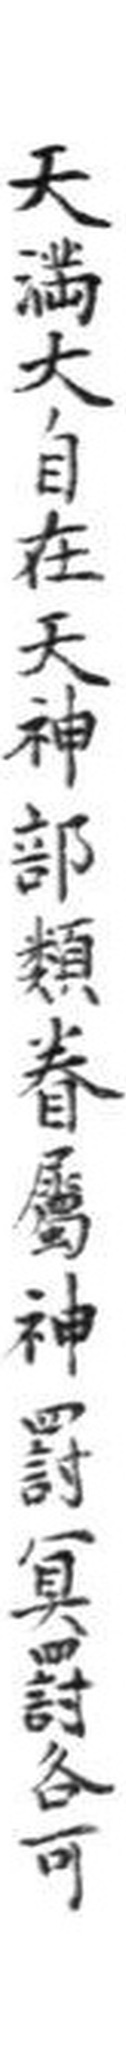天満大自在天神部類眷属神罰冥罰各可
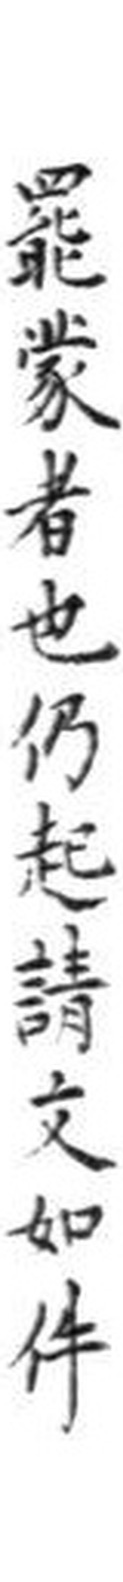罷蒙者也仍起請文如件
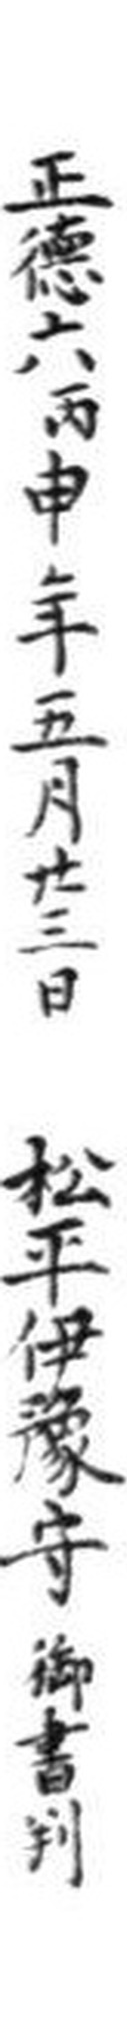正徳六丙申年五月廿三日松平伊予守御書判
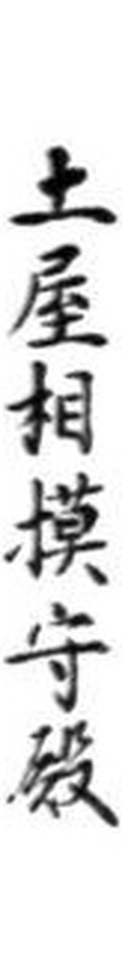土屋相模守殿
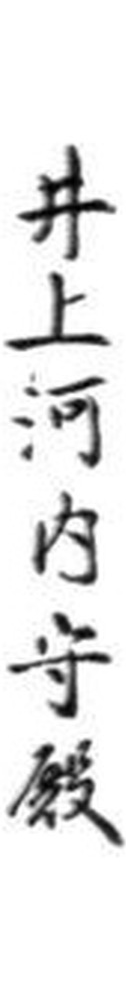井上河内守殿
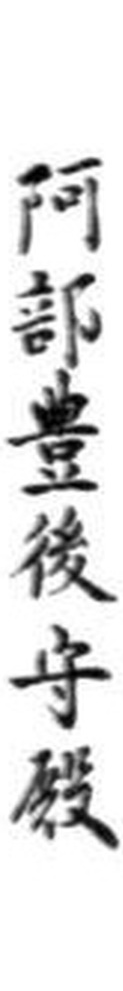阿部豊後守殿
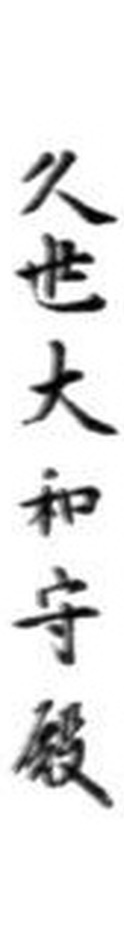久世大和守殿
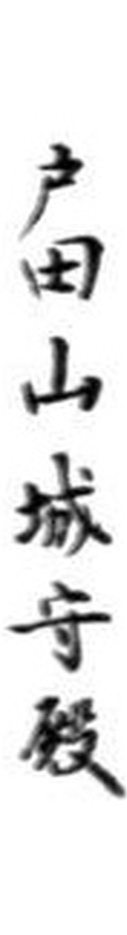戸田山城守殿
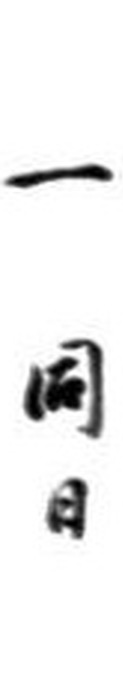一同日
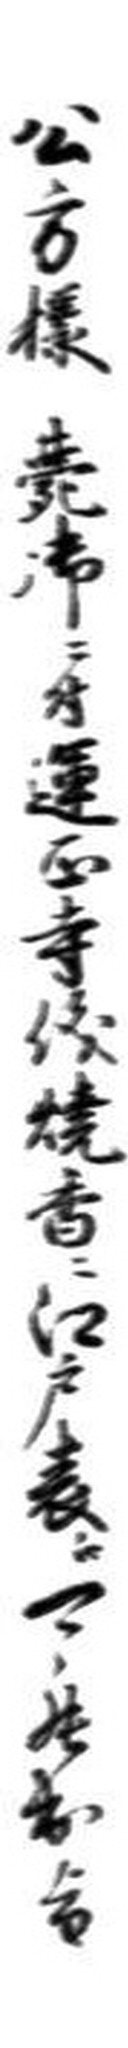公方様薨御ニ付運正寺儀焼香ニ江戸表江可罷出旨
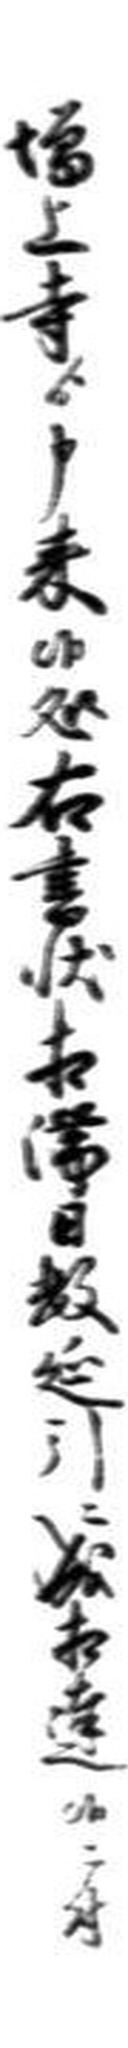増上寺ゟ申来候処右書状相滞日数延引ニ成相達候ニ付
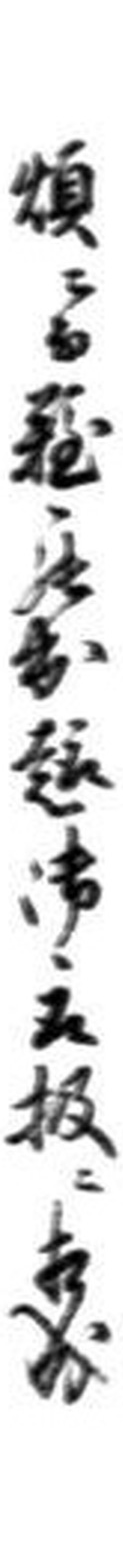煩ニ而難罷出趣御取扱ニ相成
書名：家譜 三十一 吉邦公 享保元年
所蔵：福井県文書館 Fukui Prefectural Archives
